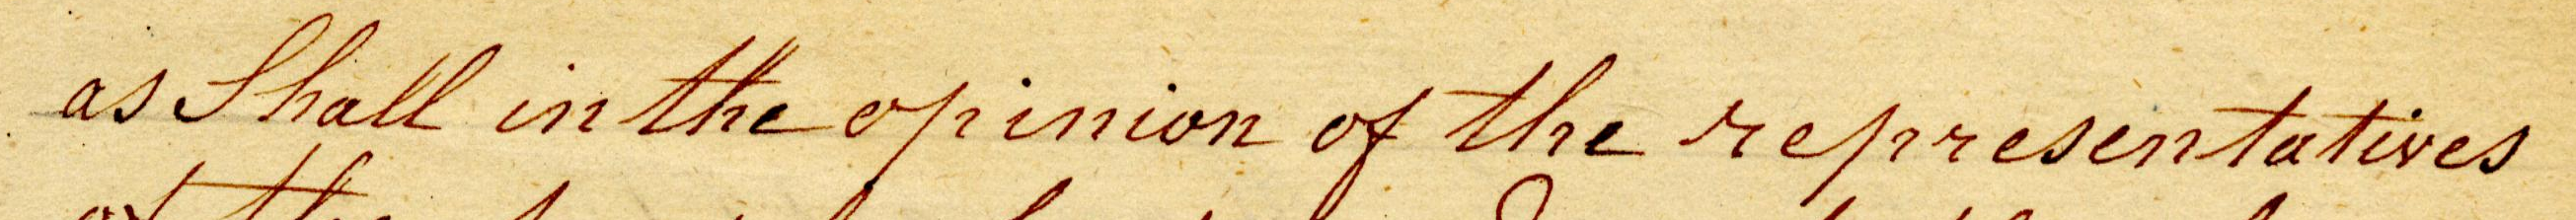as shall in the opinion of the representatives
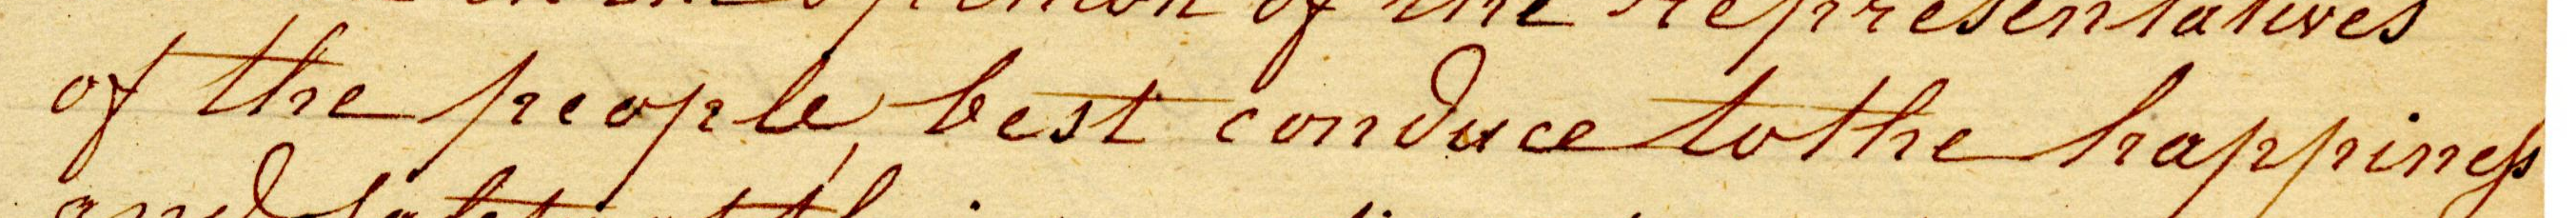of the people, best conduce to the happiness
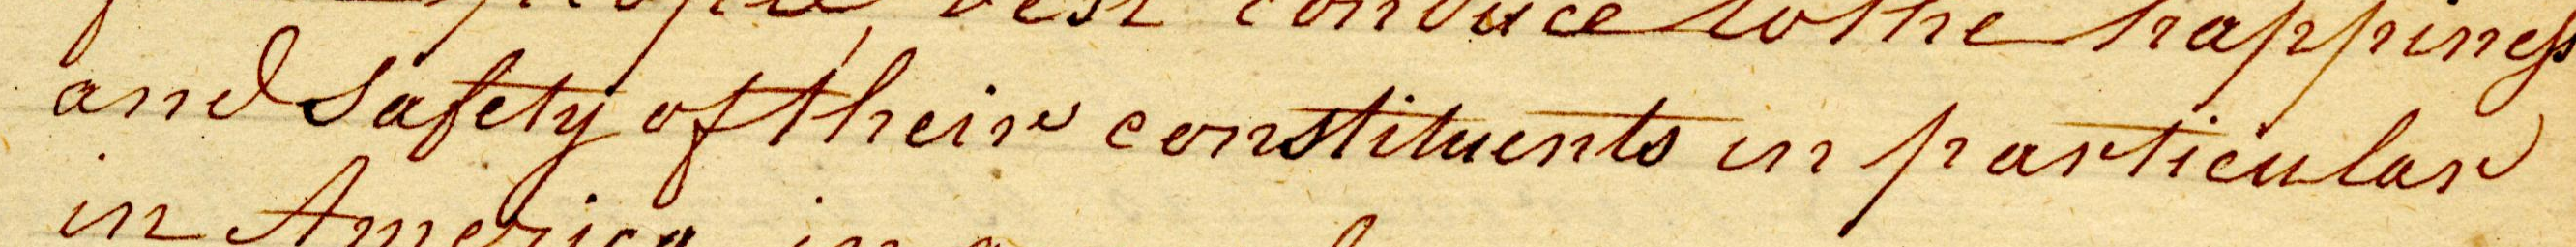and safety of their constituents in particular
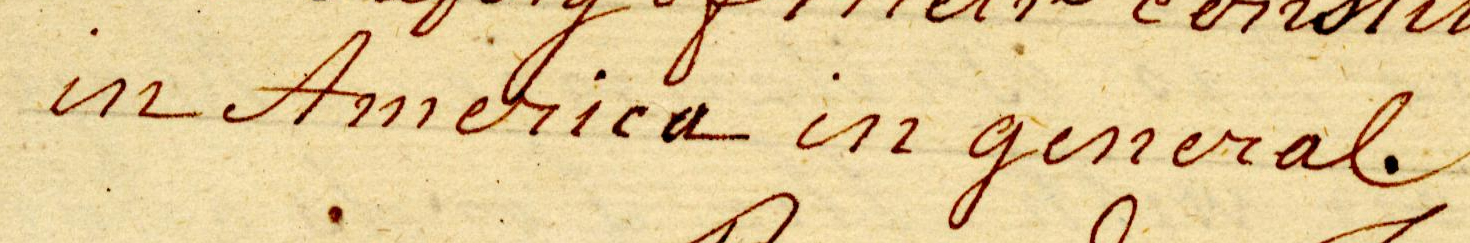in America in general.
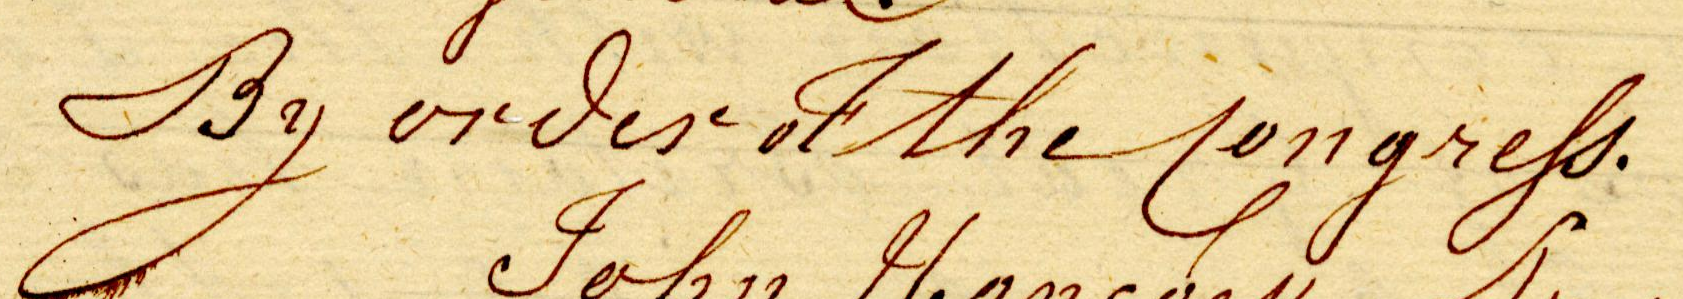By order of the Congress.
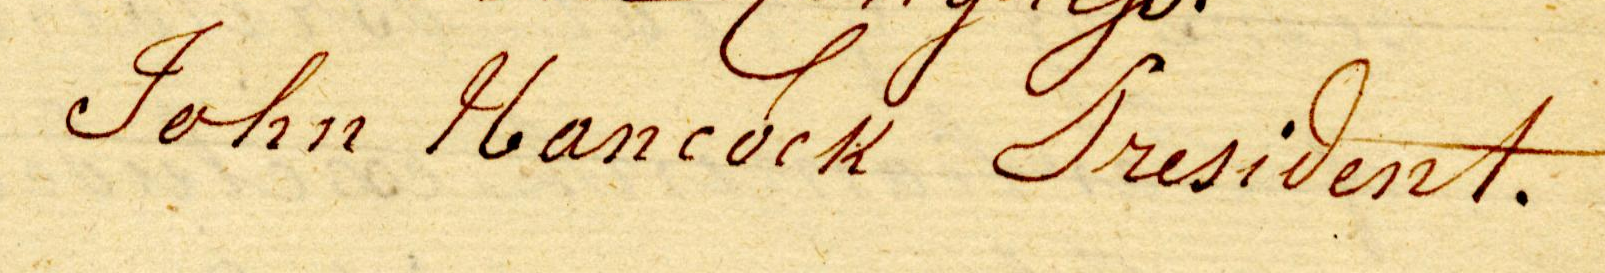John Hancock President.
